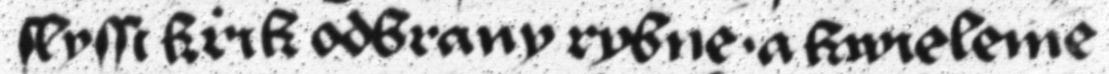ſlyſſí kṙik odbrany rybné. a kwieleníe
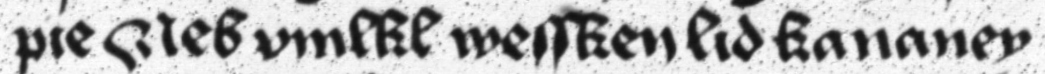pie Neb vmlkl weſſken lid kananey
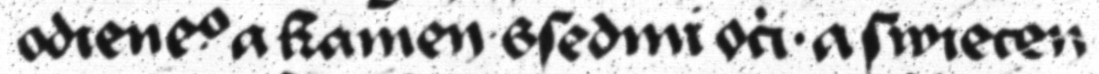odiene° a kamen sſedmi oċi, a ſwíecen
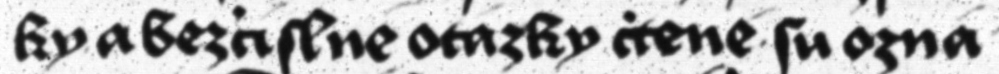ky a bezċíſlné otázky ċtené ſu ozná
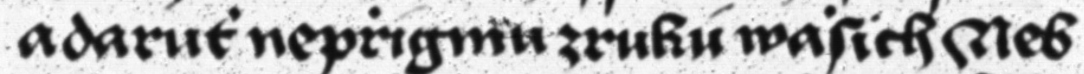a daruť nepṙigmmu zrukú waẛich Neb
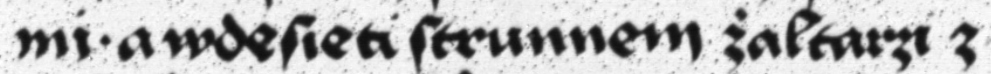mi. a wdeſieti strunnem żaltarzi z
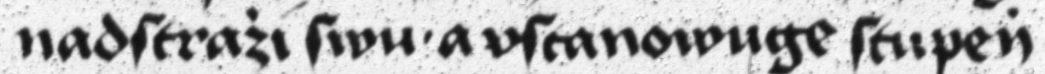nadſtrażí ſwu. a vſtanowuge ſtupeṅ
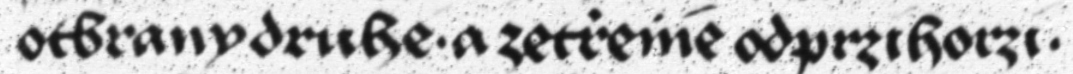otbrany druhe. a zetṙeṅie odprzihorzí.
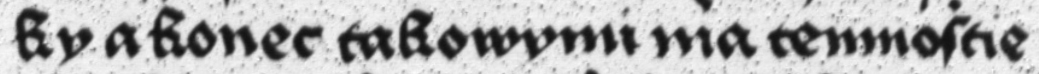ky a konec takowymi ma temnoẛtíe
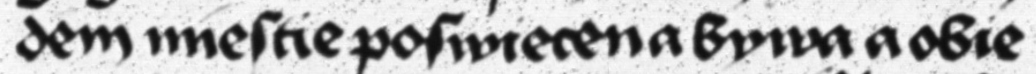dem míeſtie poſwiecena bywa a obie
